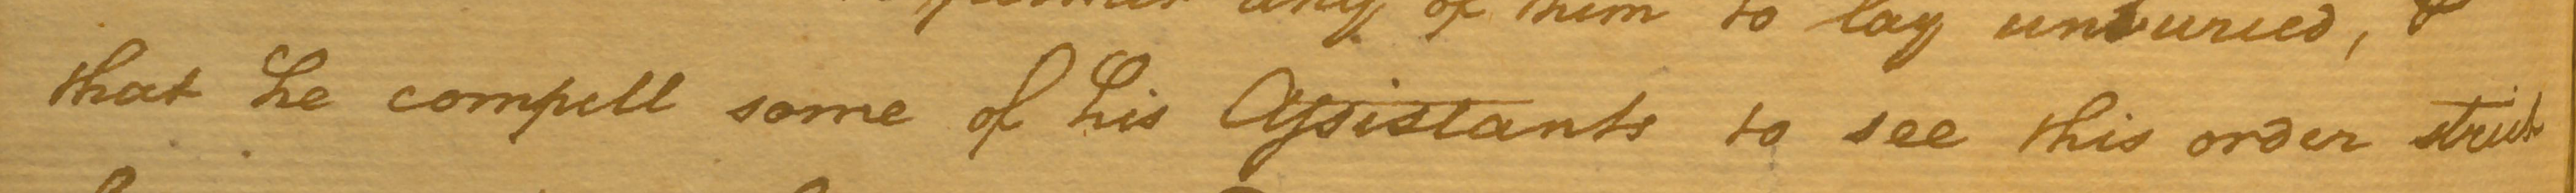that he compell some of his Assistants to see this order strict
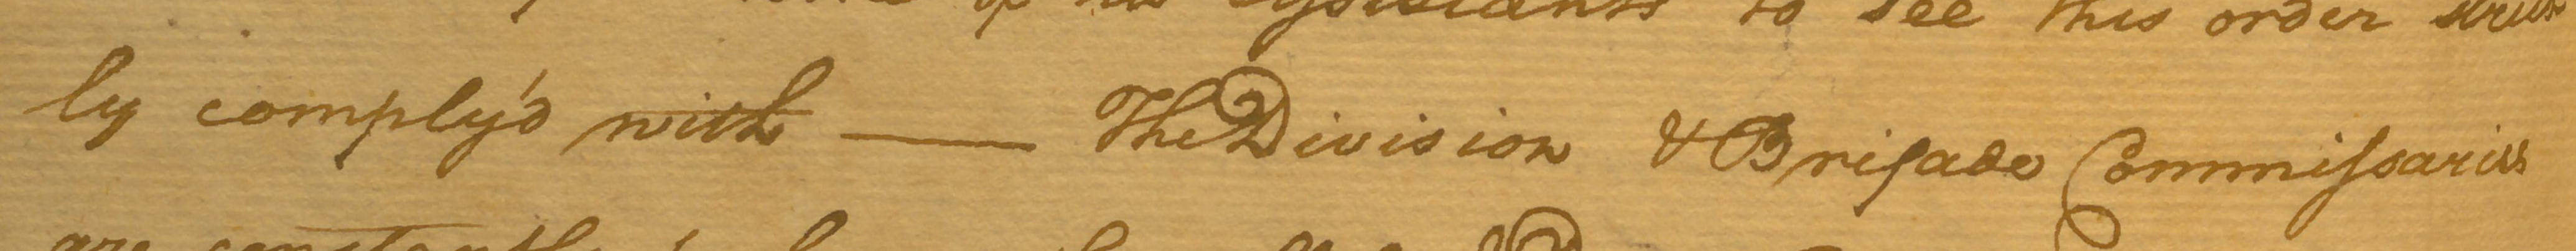ly comply'd with- The Division & Brigade Commissaries
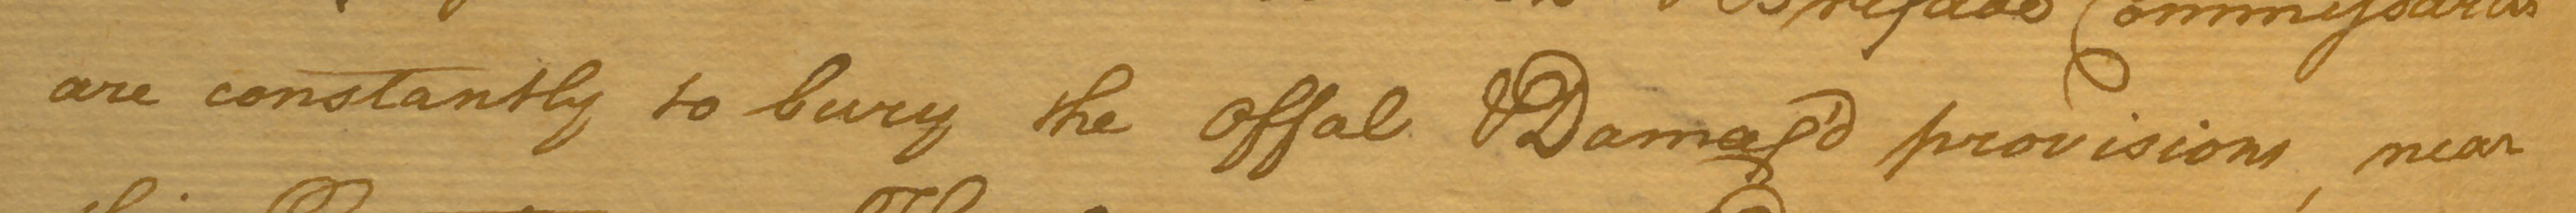are constantly to bury the Offal & Damag'd provisions, near
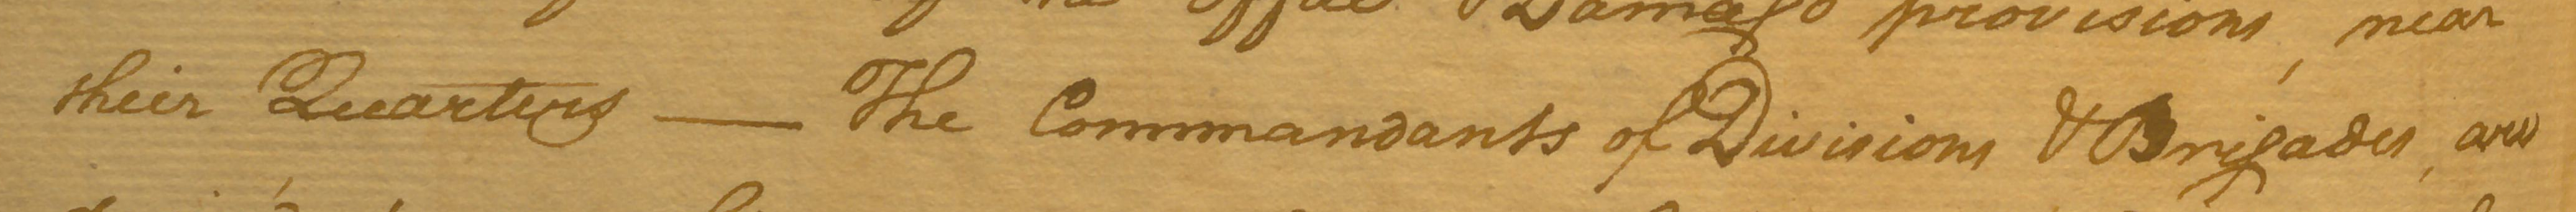their Quarters- The Commandants of Divisions & Brigades are
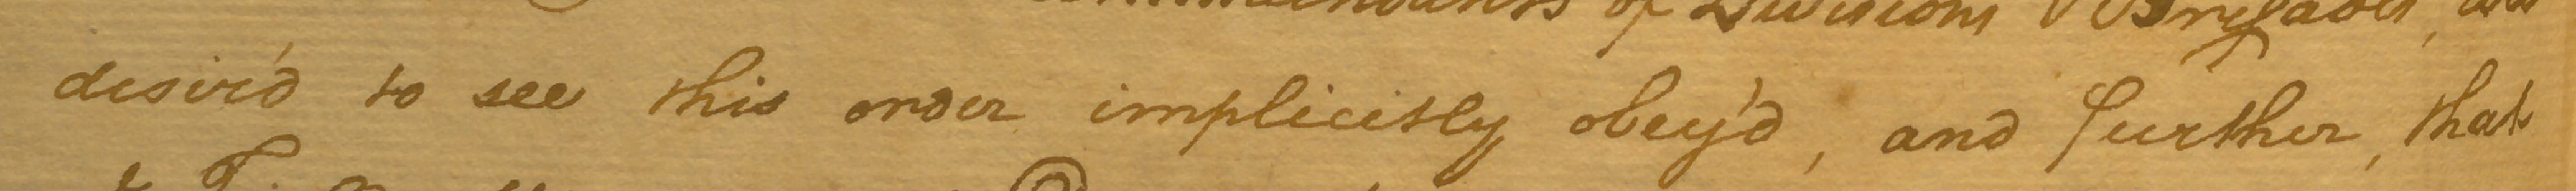desir'd to see this order implicitly obey'd, and further, that
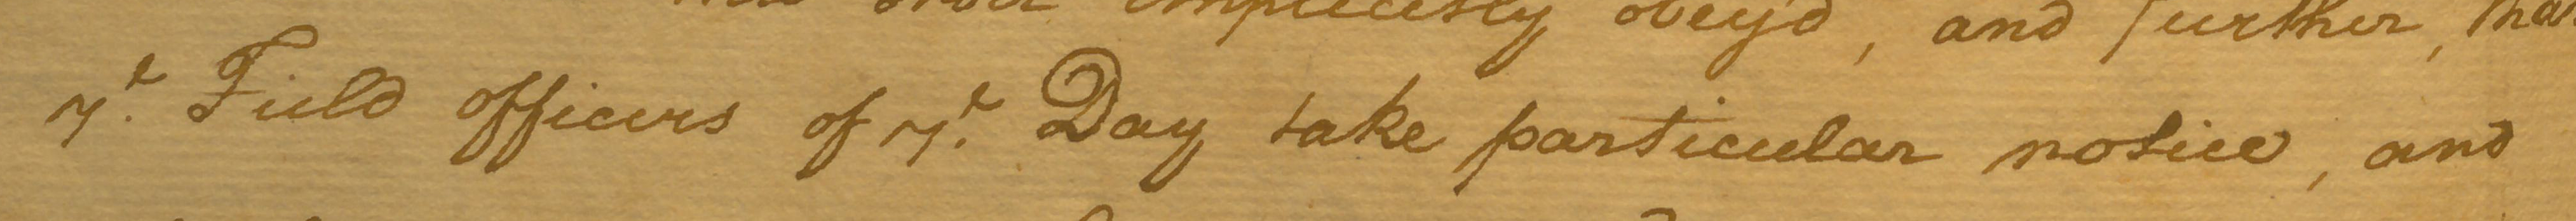y^e. Field officers of y^e. Day take particular notice, and
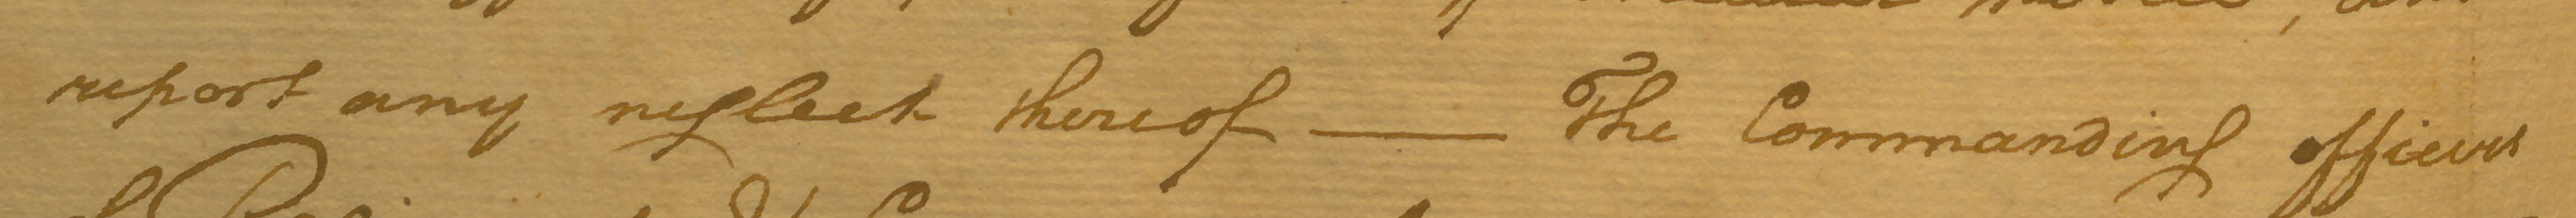report any reflect thereof- The Commanding officers
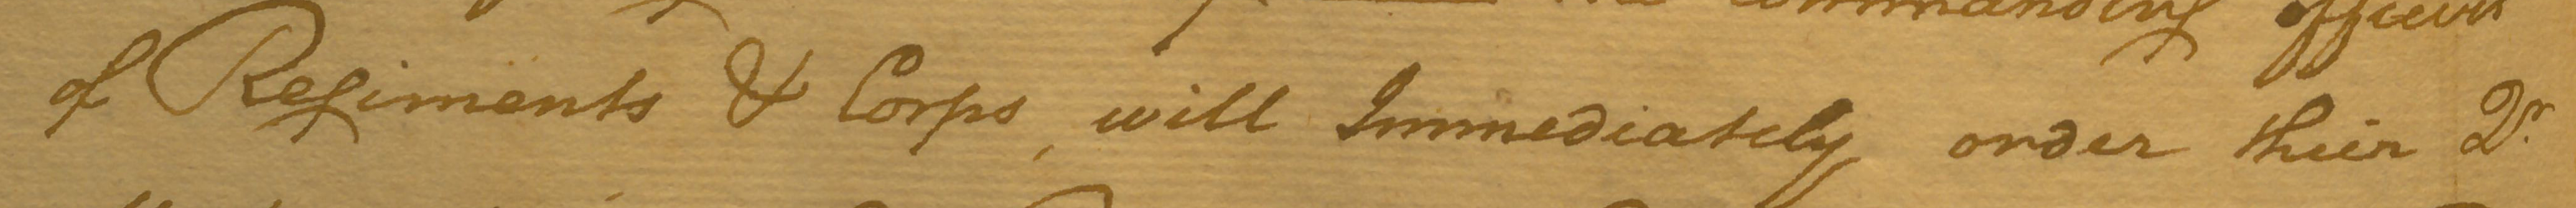of Regiments & Corps, will Immediately order their Q^r.
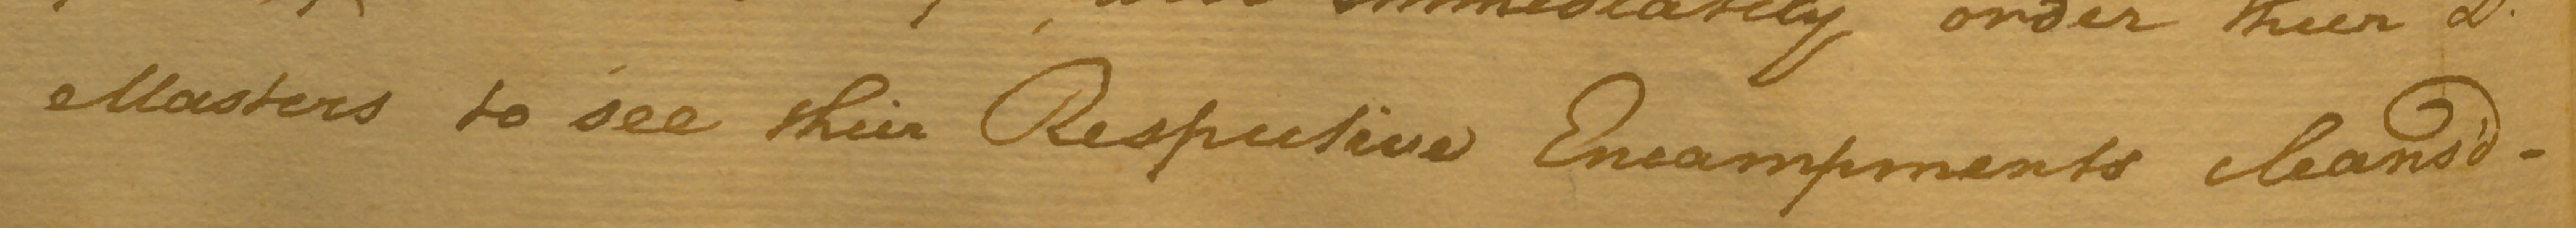Masters to see their Respective Encampments cleans'd-
